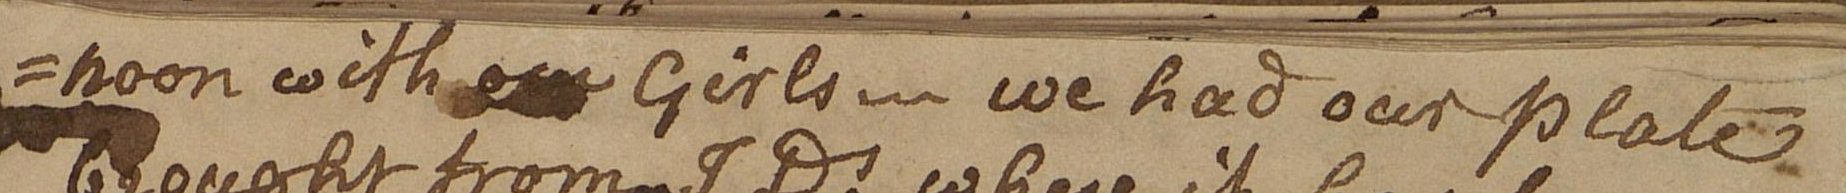-noon with our Girls- we had our plate
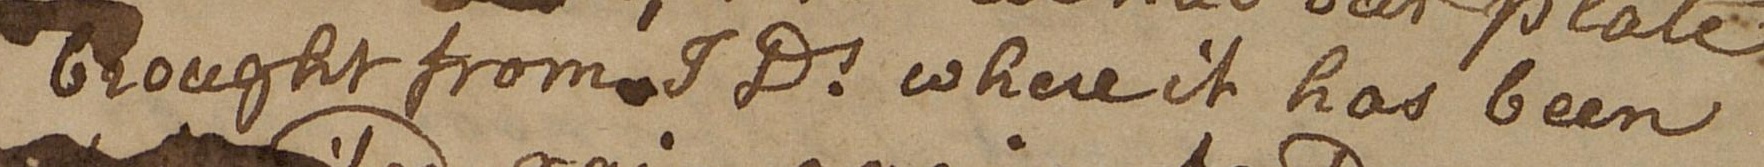brought from J D^s. where it has been
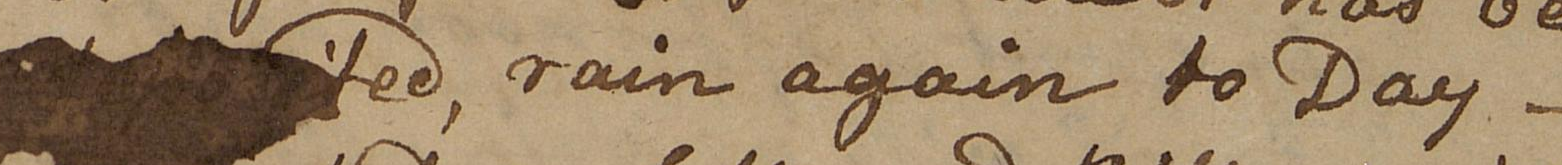deposited, rain again to Day-
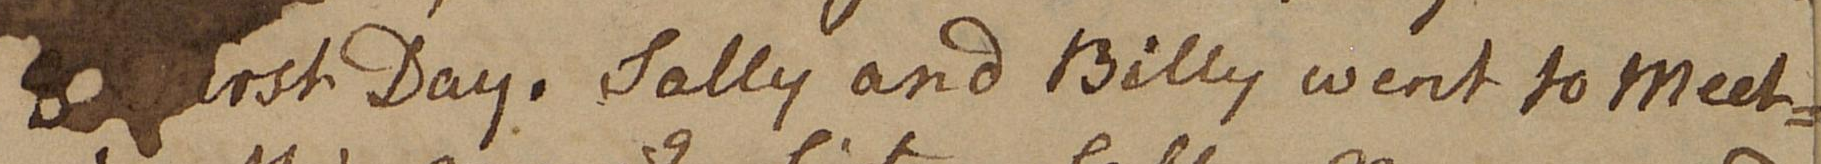First Day. Sally and Billy went to Meet-
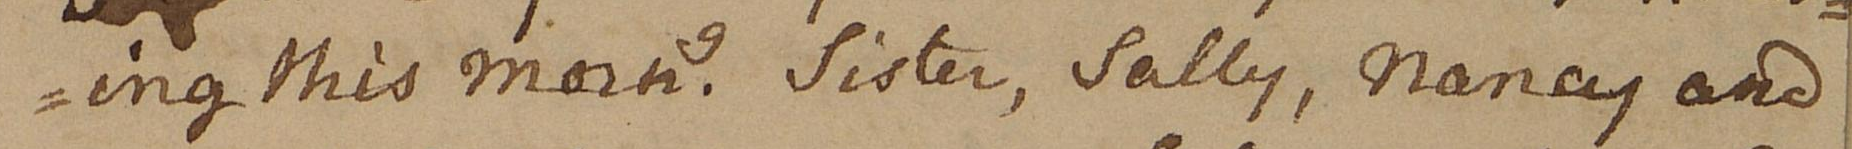-ing this morn^g. Sister, Sally, Nancy and
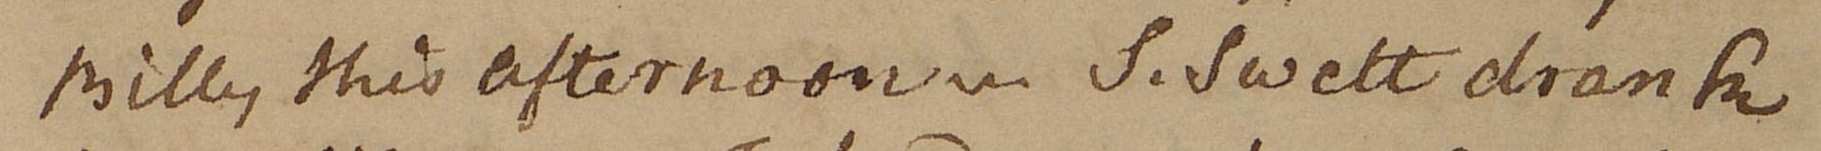Billy this afternoon- S. Swett drank
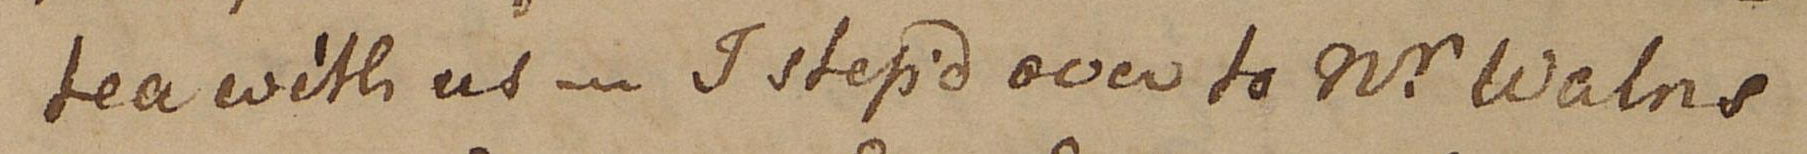tea with us- I step'd over to N^r. Walns
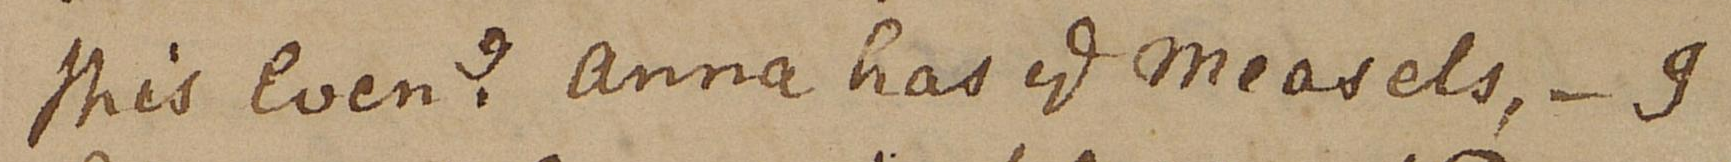this Even^g. Anna has y^e Measels- I
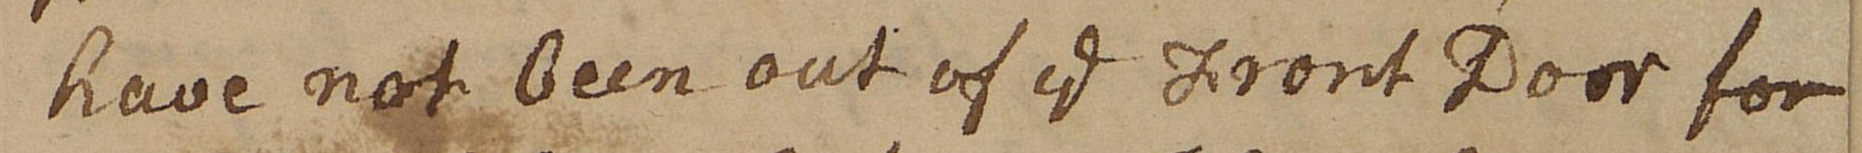have not been out of y^e Front Door for
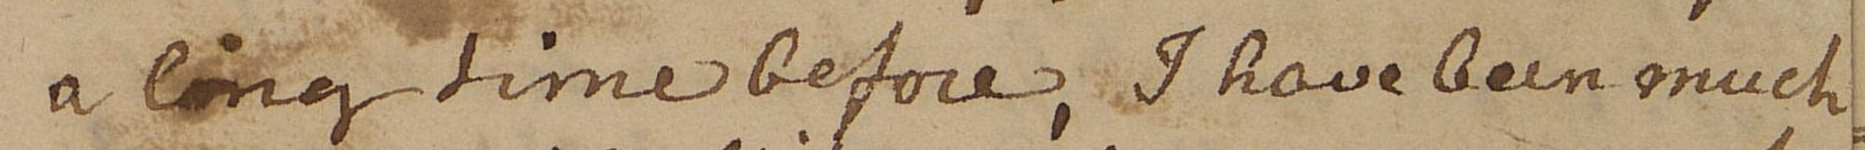a long time before, I have been much
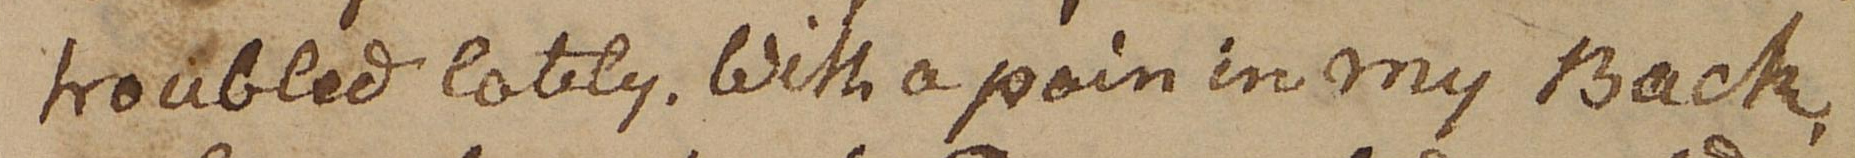troubled lately. With a pain in my Back,
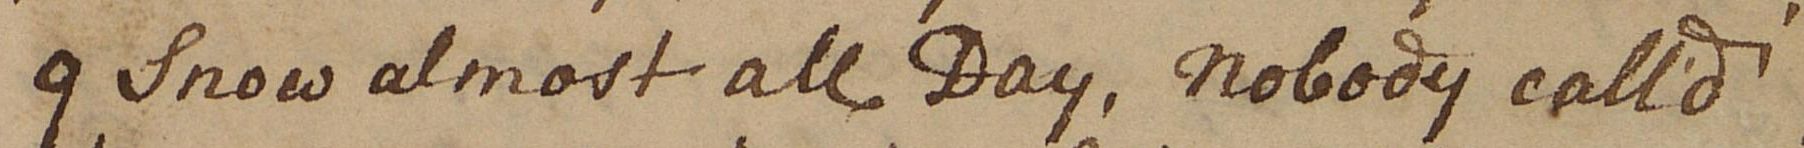9 Snow almost all Day, nobody call'd
